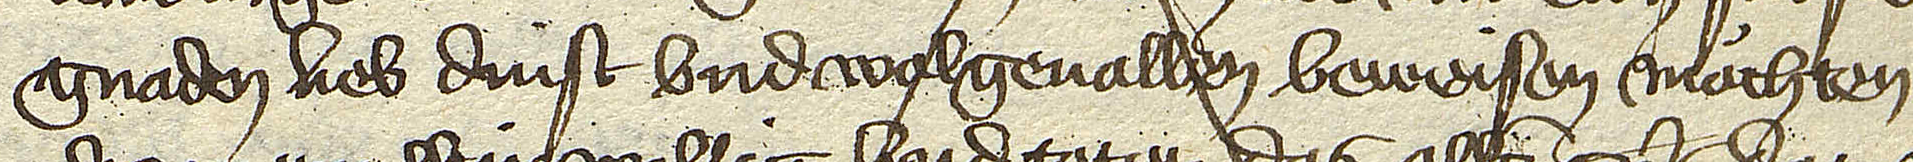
gnaden lieb dinſt vnd wolgeuallen beweiſen möchten
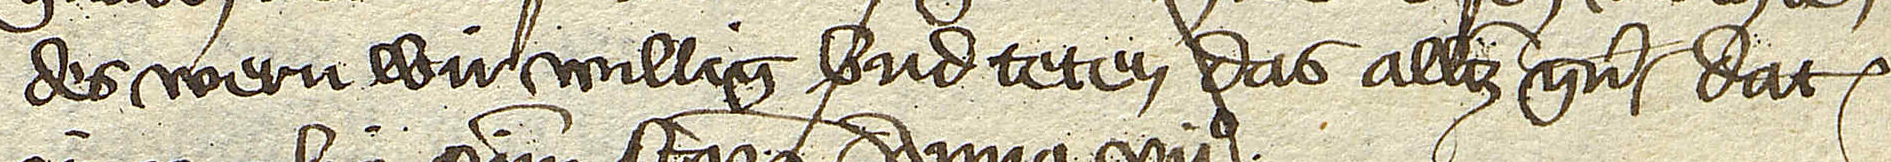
des wern wir willig vnd teten das allcʒ* gn* / dat*
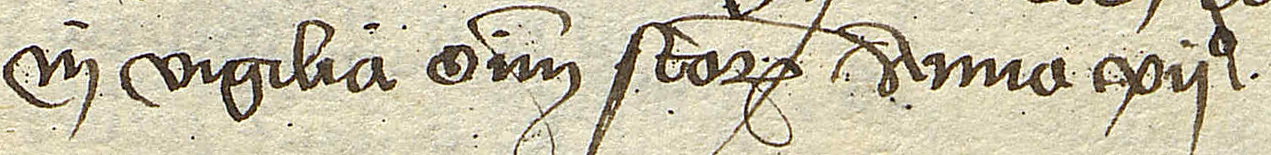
in vigilia Omi* ſco* / Anno xii*
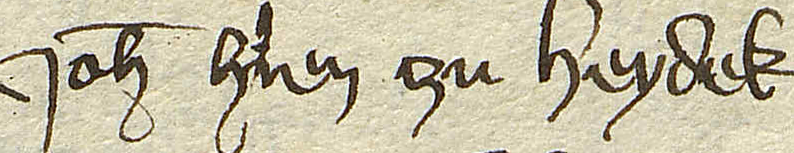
Ioh* h*ren cʒu Heydek
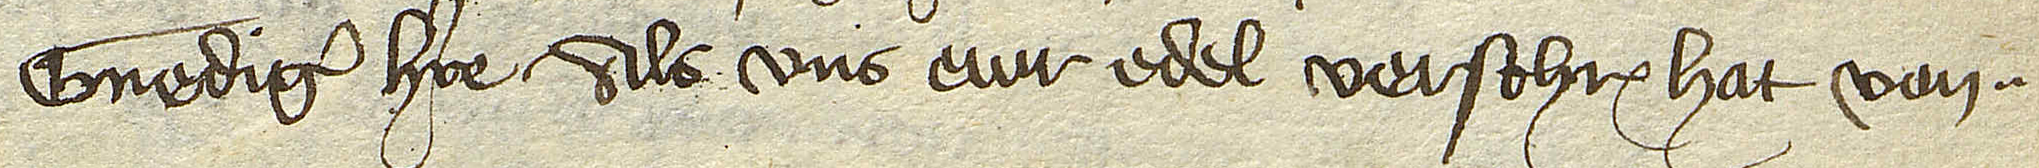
Gnedig* h*re / Als vns ewr edel verſchr* hat von ~
